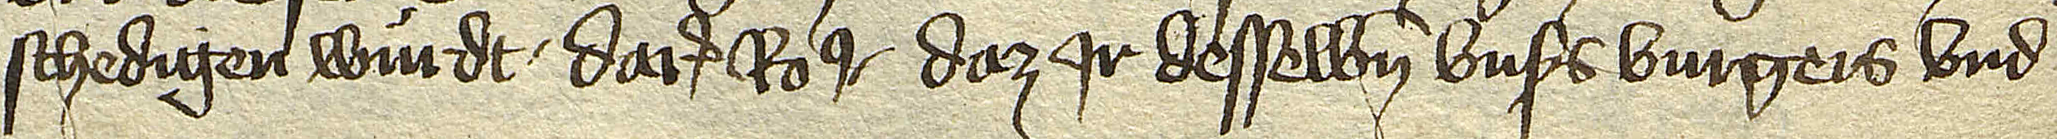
ſchedigen würdt / dar* Ro* / daʒ Ir deſſelbn* vnſ*s burgers vnd
